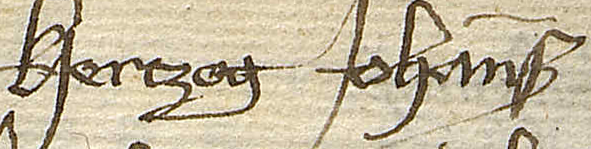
Hercʒog Iohan*ſ*
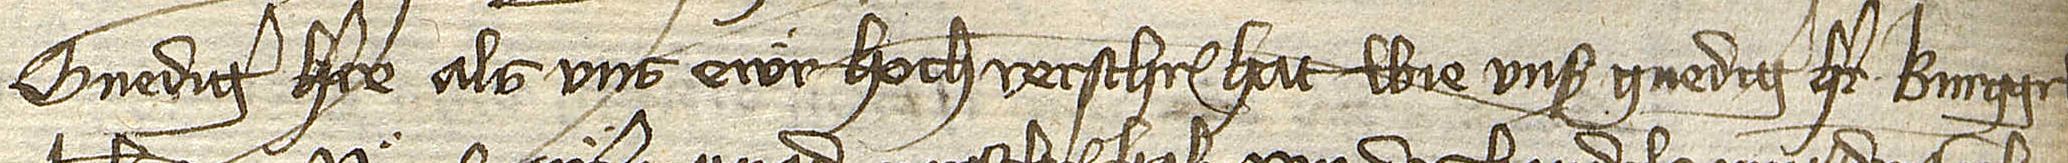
Gnedig* h*re als vns eẅr hoch* verſchr* hat wie vnſ* gnedig* h*r Burggr*
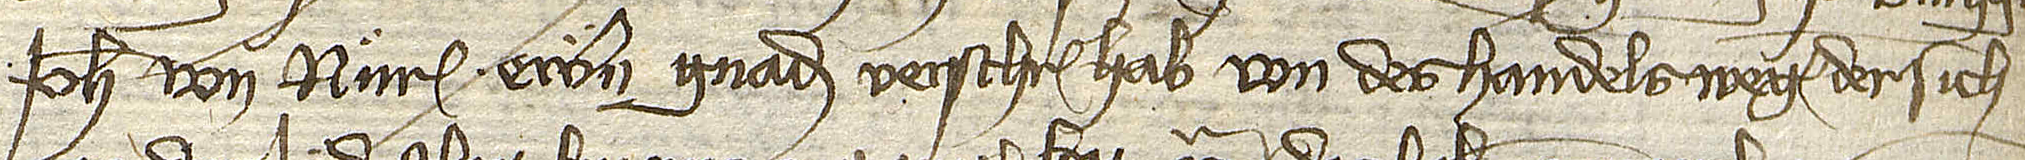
Ioh* von Nür* eẅ*n gnad* verſchr* hab von des handels weg* der ſich
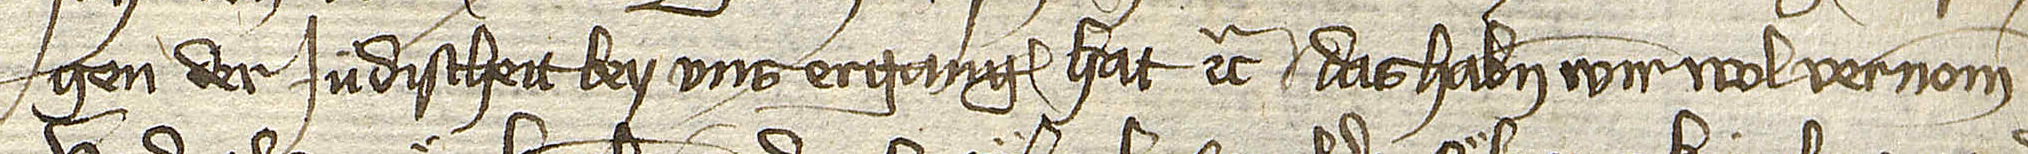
gen der Iüdiſcheit bey vns ergang* hat ec* / Das habn* wir wol vernom*
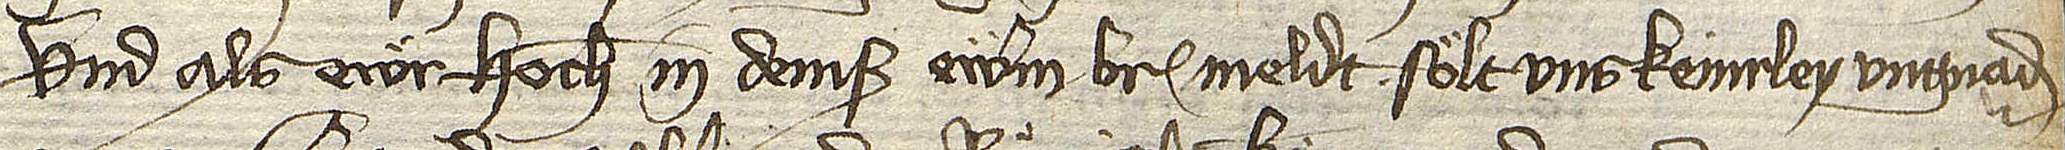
Vnd als eẅr Hoch* in demſ* eẅ*n br* meldt . ſölt vns keinrley vngnad*
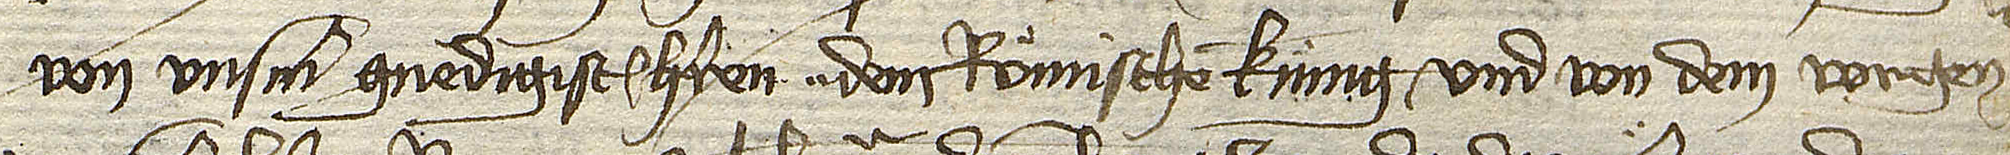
von vnſm* gnedigiſt* h*ren ~ dem Römiſche* künig vnd von dem vorgen*
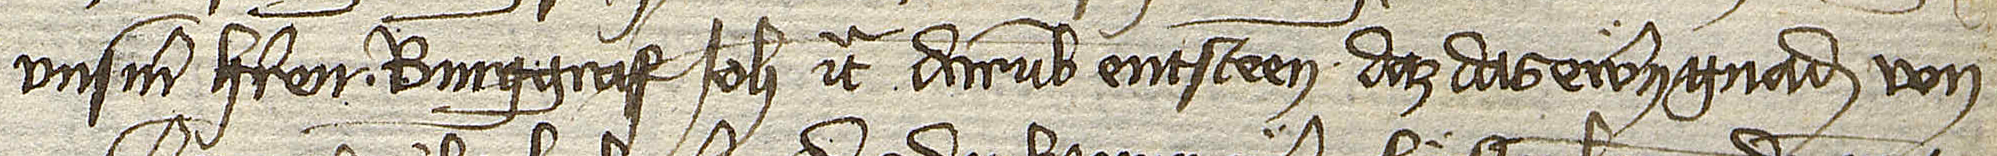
vnſm* h*ren . Burggraf Ioh* ec* darub* entſteen . daʒ das eẅ*n gnad* von
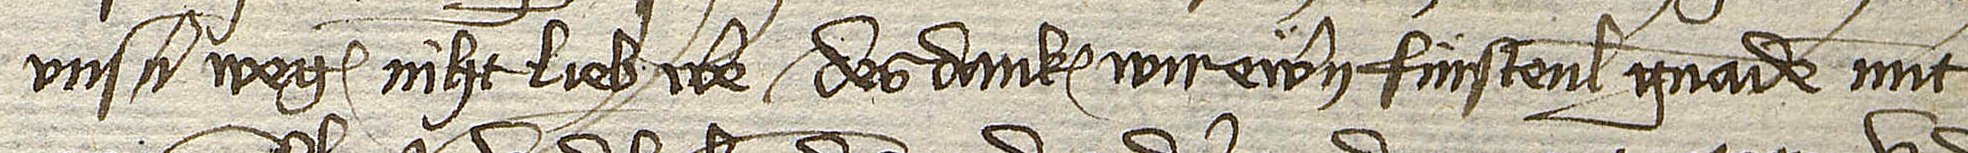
vnſn* weg* niht lieb w*e / Des dank* wir eẅ*n fürſtenl* gnade mit
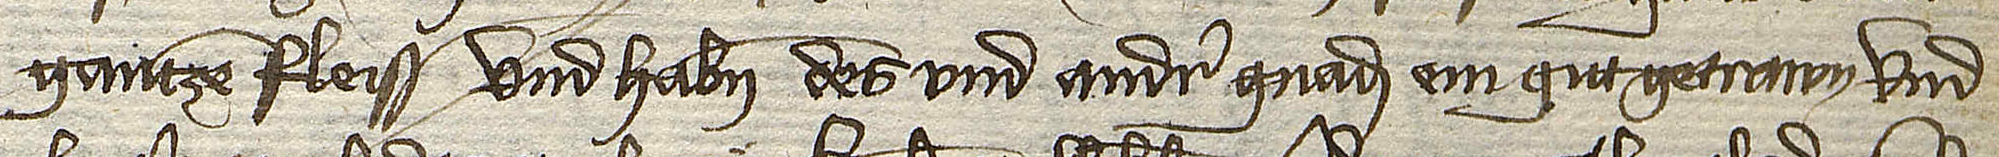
gancʒe* fleiſſ Vnd habn* des vnd andr* gnad* ein gut getrawn Vnd
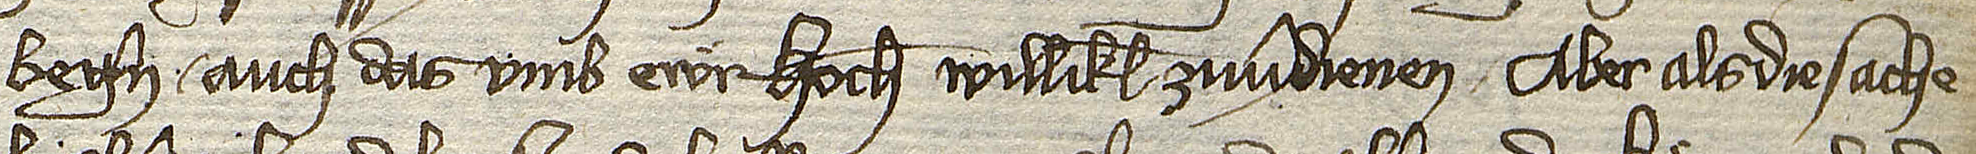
beg*n / auch das vmb eẅr Hoch* willikl* ʒuu*dienen Aber als die ſache
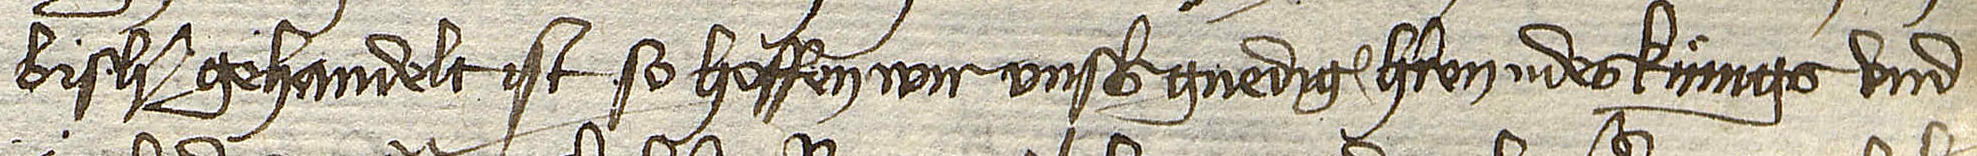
biſh* gehandelt iſt ſo hoffen wir vnſ*s gnedig* h*ren ~ des künigs vnd
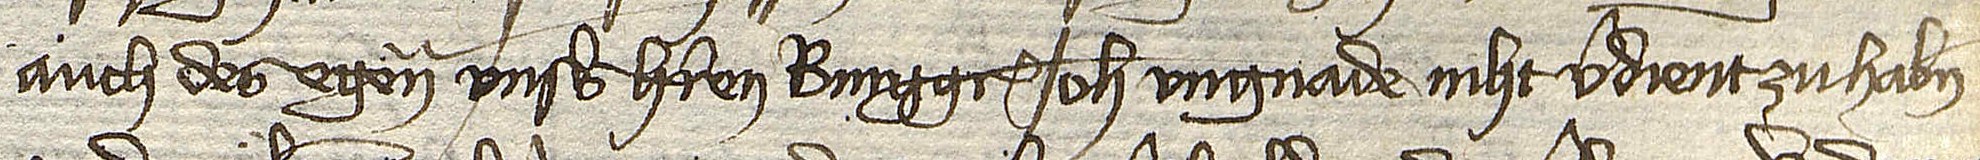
auch des egen* vnſ*s h*ren Burggr* Ioh* vngnade niht v*dient ʒu habn*
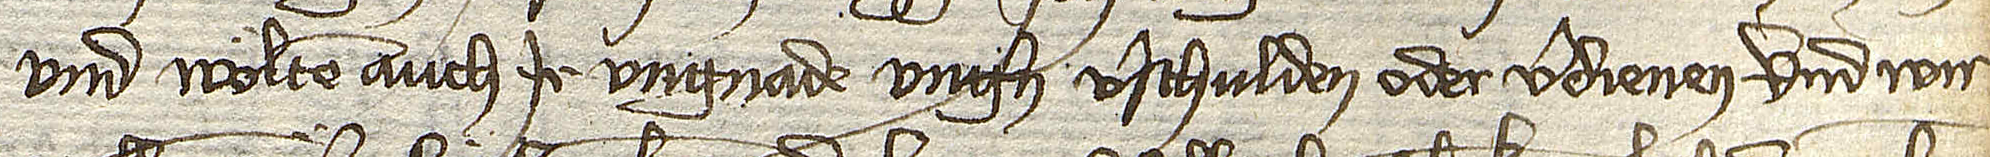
vnd wölte* auch Ir vngnade vng*n v*ſchulden oder v*dienen Vnd wir
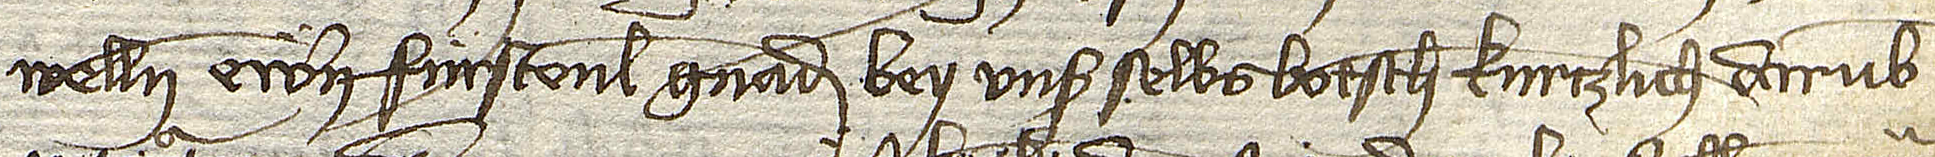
welln* eẅ*n fürſtenl* gnad* bey vnſ* ſelbs botſch* kurcʒlich darub*
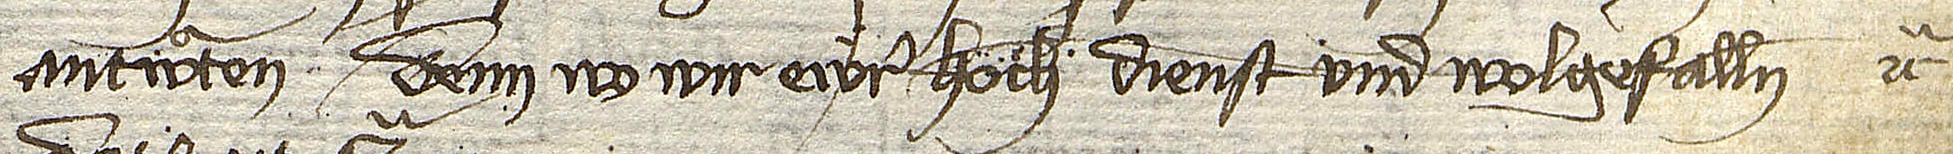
antw*ten / Denn wo wir eẅr* hoch* dienſt vnd wolgefalln* ec*
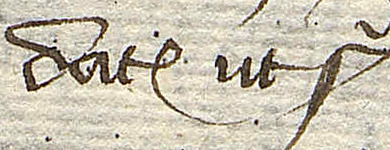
Dat* ut ſ*
